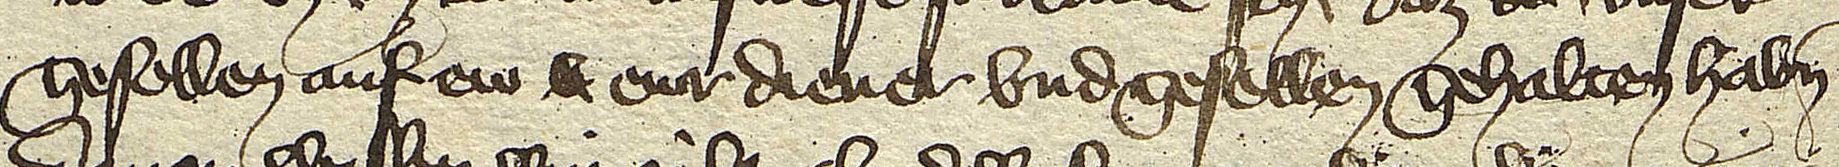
geſellen auf ew v ewr diener vnd geſellen gehalten habn*
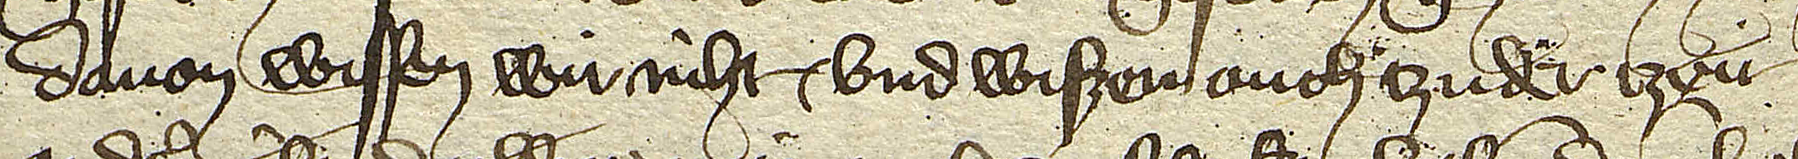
dauon wiſſen wir niht / vnd wiſʒen auch cʒu der cʒeit
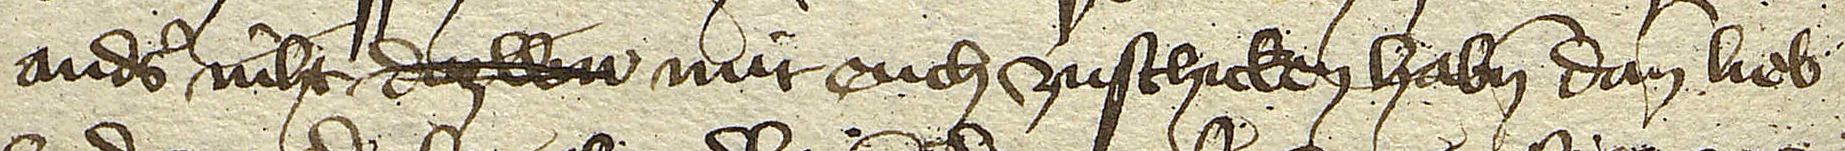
ands* niht / daʒ wir mit euch cʒuſchicken han* dan* lieb
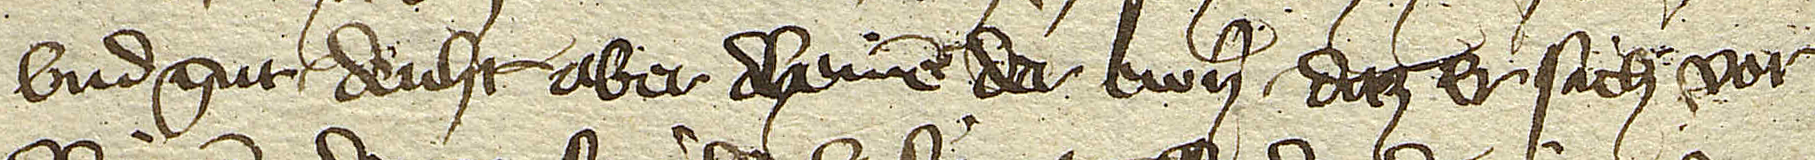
vnd gut / deuht aber dheine* der ewn* / daʒ Er ſich vor
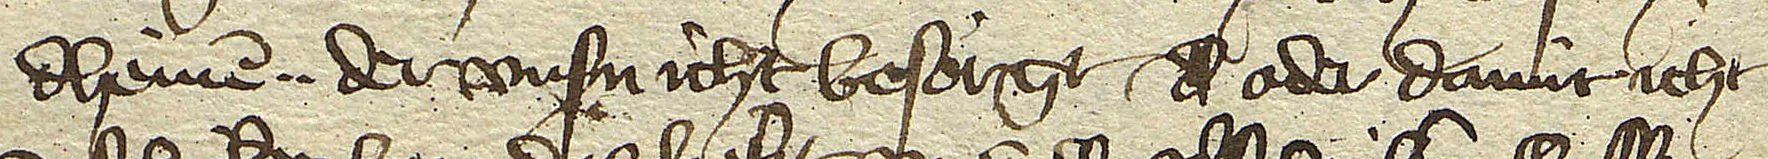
dheine* ~ der vnſ*n icht beſorgt / d oder damit icht
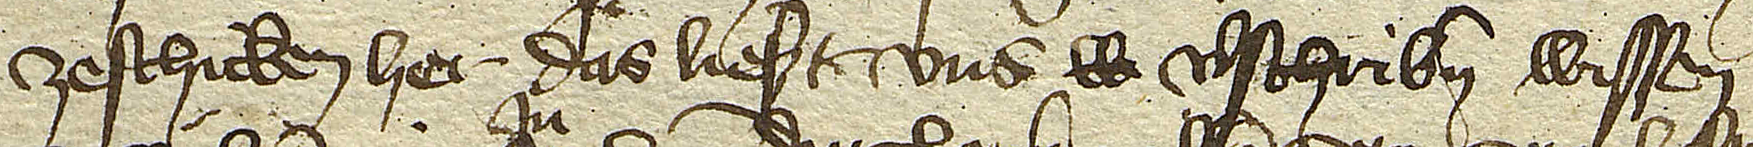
cʒeſchicken her das lieſʒt vns w v*ſchribn* wiſſen
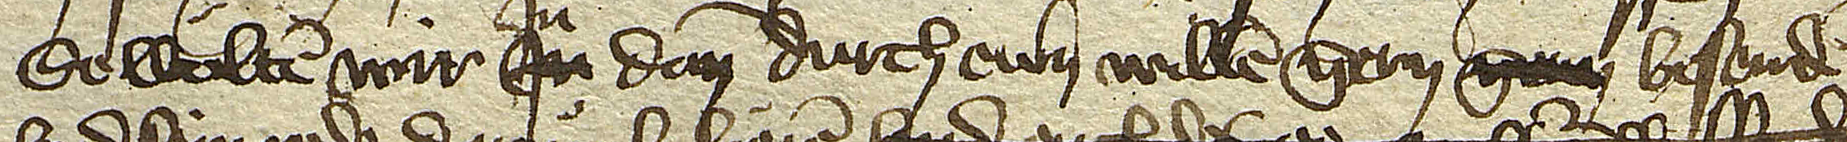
So wölte* wir In dan* durch ewn* wille* gern gern beſende*
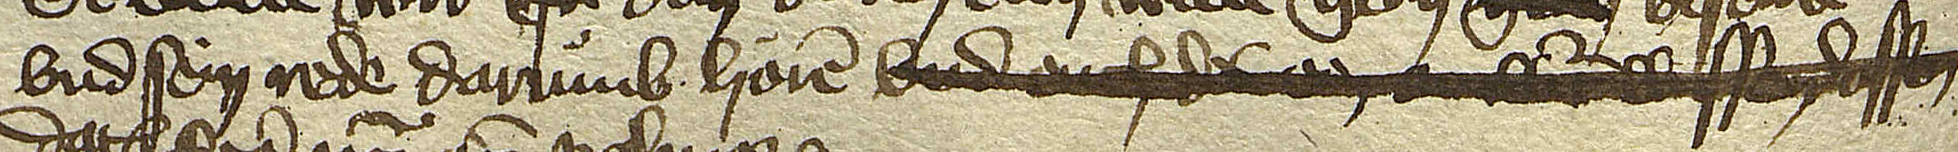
vnd ſein rede darümb höre* vnd euch des ein* antwt* wiſſen laſſen
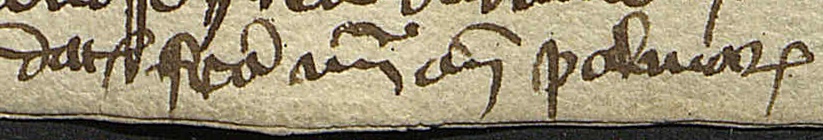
dat* fea* iiii* an* Palma*
